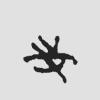寺
